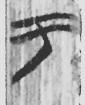于
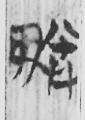朕
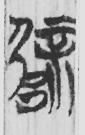辟
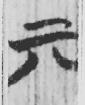亓
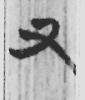又
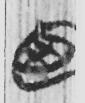廼
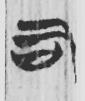司
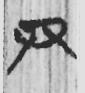四
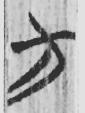方
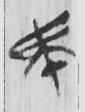民
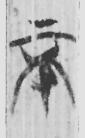不
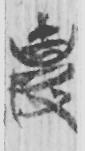尅
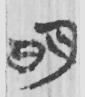明
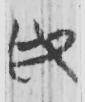女
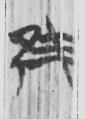隹
